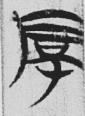厚
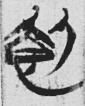○（食）
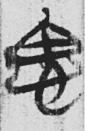思
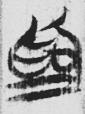爲
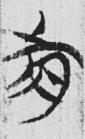前
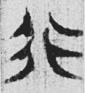行
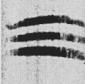三
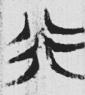行
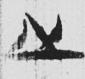之
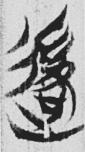○（後）
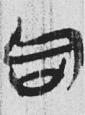句（苟）
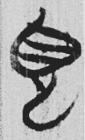見
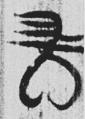耑（短）
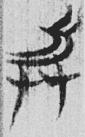兵
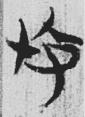{十攴}（什）
